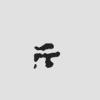亓（其）
